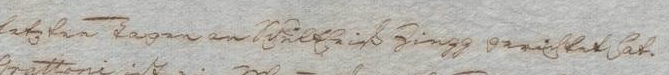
letzten Tagen an Schultheiß Zingg gerichtet hat.
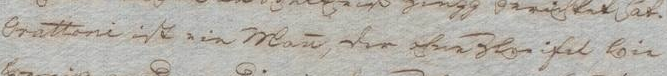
Grattoni ist ein Mann, der ohne Zweifel wie
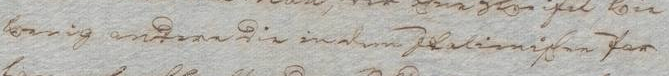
wenig andere die in dem Italienischen Par-
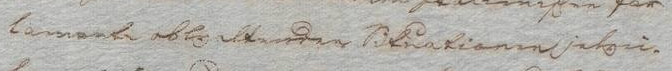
lamente obwaltenden Situationen jewei-
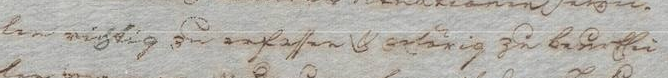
len richtig zu erfassen & gehörig zu beurthei-
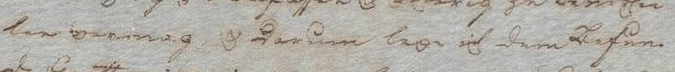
len vermag & darum lege ich dem Befun-
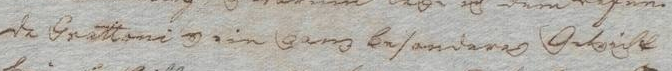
de Grattoni's ein ganz besonderes Gewicht
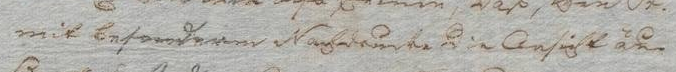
mit besonderm Nachdrucke die Ansicht äu-
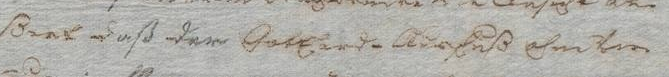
ßert, daß der Gotthard-Ausschuß ohne Ver-
